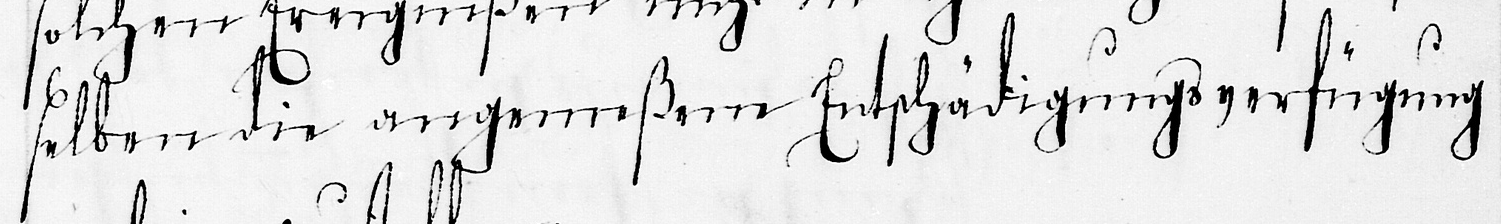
selben die angemeßene Entschädigungsverfügung
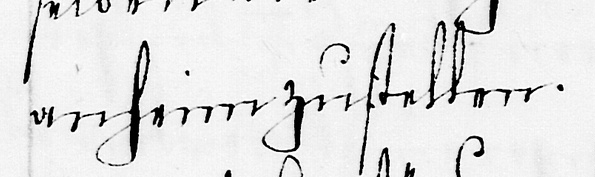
anheimzustellen.
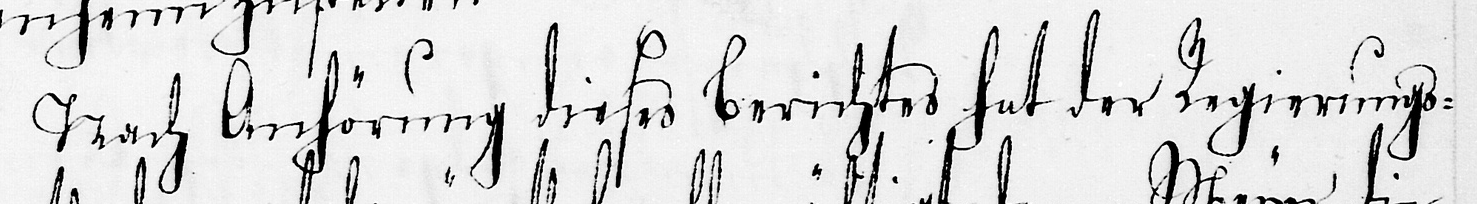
Nach Anhörung dieses Berichtes hat der Regierungs¬
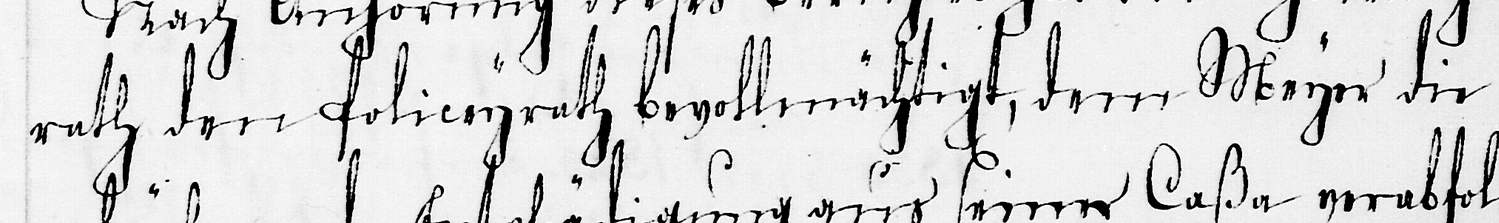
rath den Policeyrath bevollmächtigt, dem Meyer die
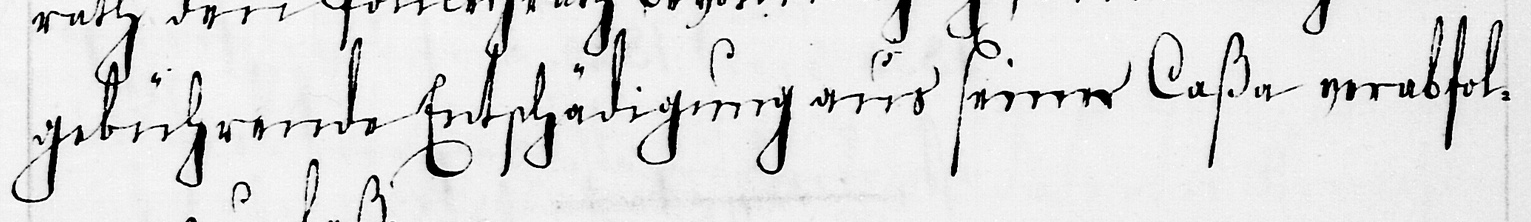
gebührende Entschädigung aus seiner Caßa verabfol¬
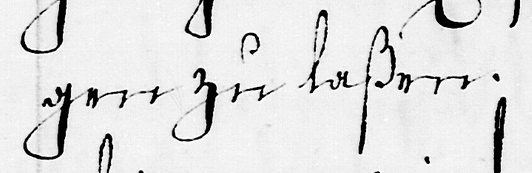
gen zu laßen.
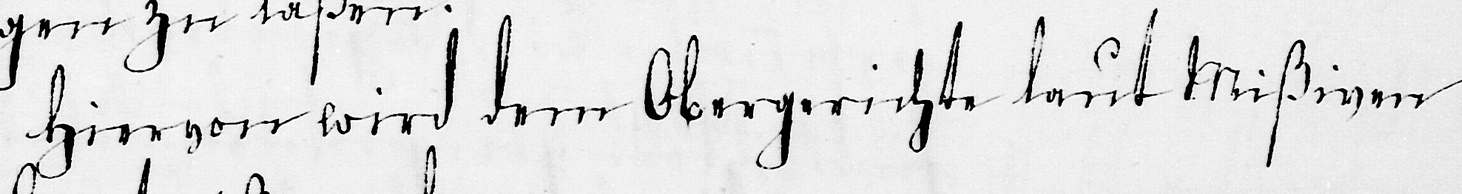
Hiervon wird dem Obergerichte laut Mißiven
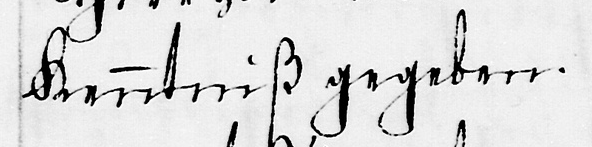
Kenntniß gegeben.
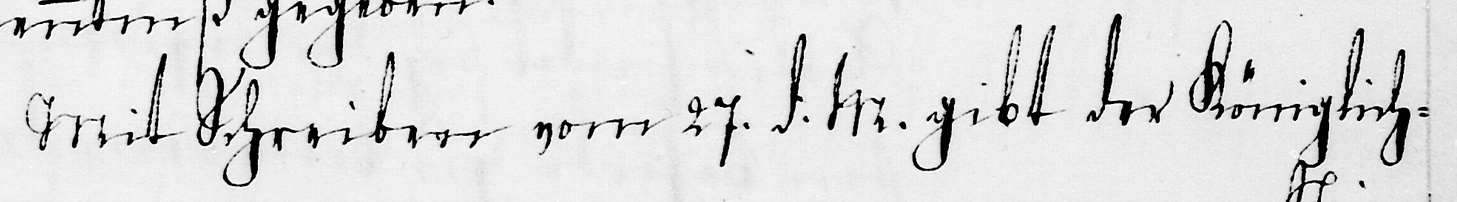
Mit Schreiben vom 27. d. M. gibt der Königlich-
